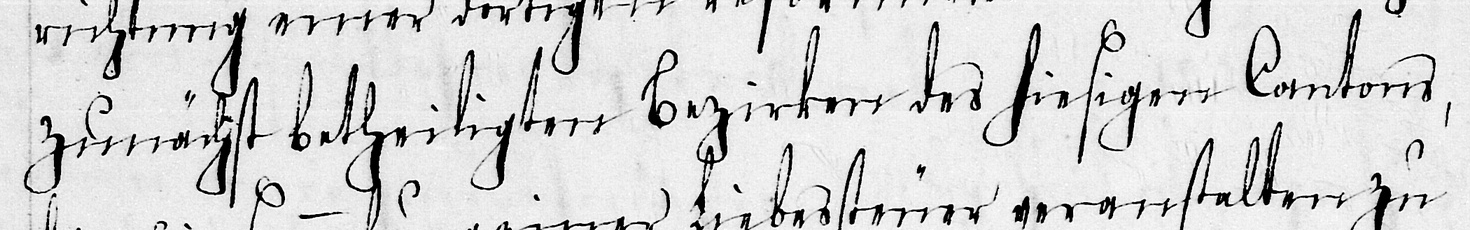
zunächst betheiligten Bezirken des hiesigen Cantons,
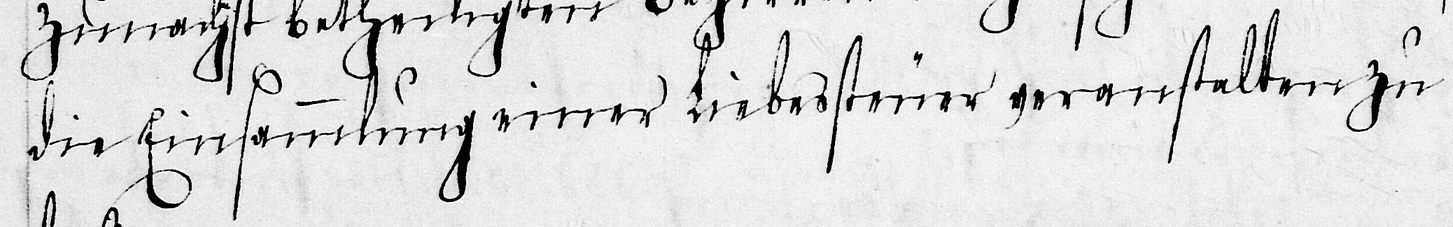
die Einsammlung einer Liebessteuer veranstalten zu
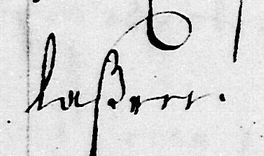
laßen.
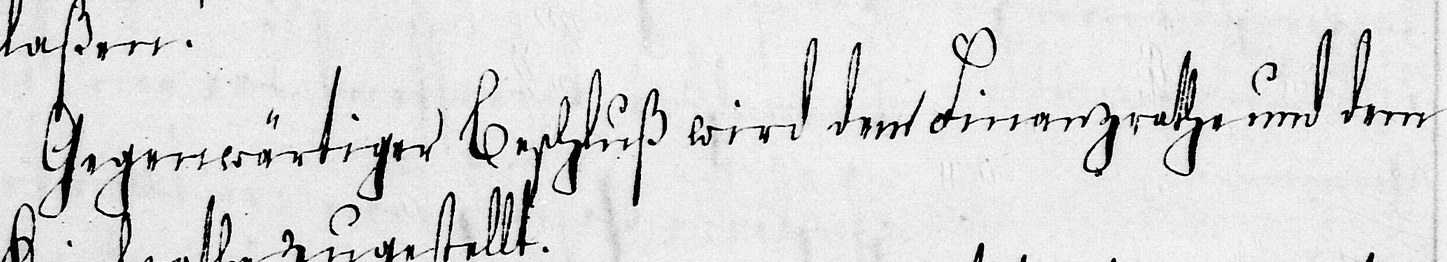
Gegenwärtiger Beschluß wird dem Finanzrathe und dem
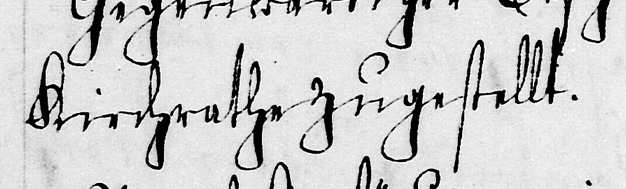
Kriegsrathe zugestellt.
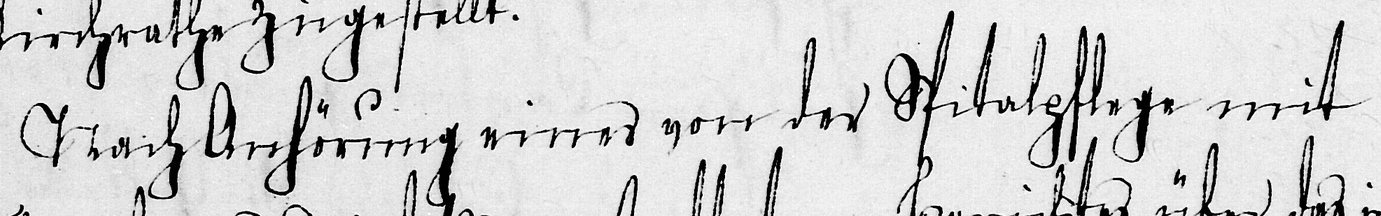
Nach Anhörung eines von der Spitalpflege mit
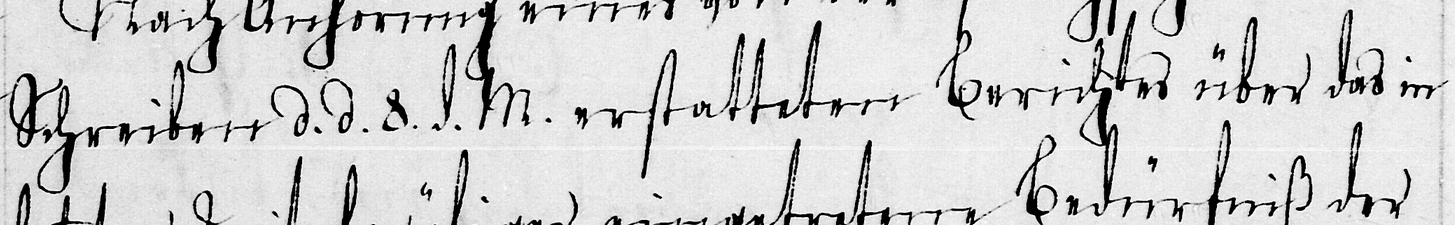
Schreiben d. d. 8. d. M. erstatteten Berichts über das in
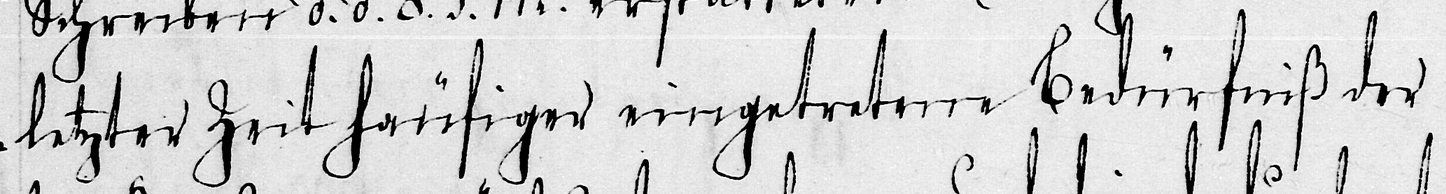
letzter Zeit häufiger eingetretene Bedürfniß der
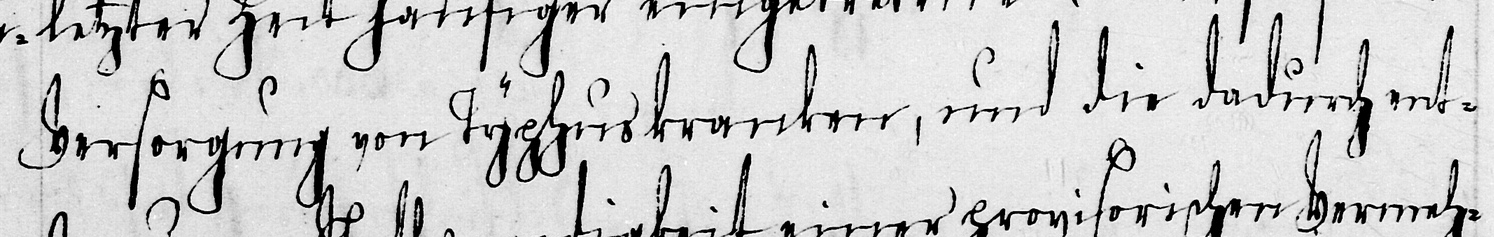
Versorgung von Typhuskranken, und die dadurch ent¬
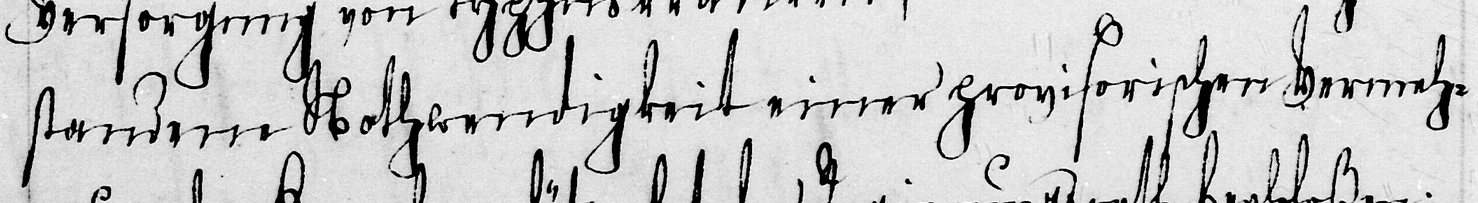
standene Nothwendigkeit einer provisorischen Vermeh¬
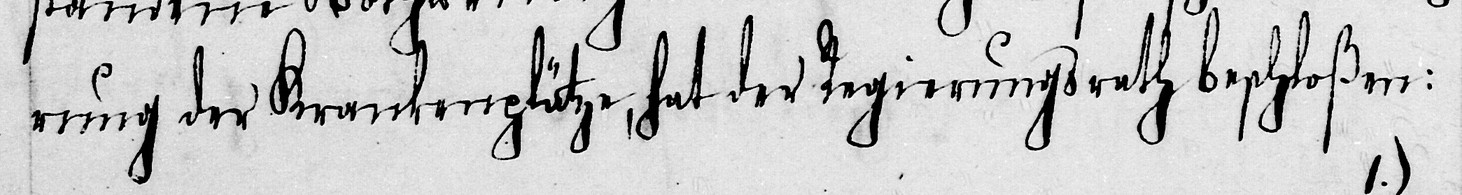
rung der Krankenplätze, hat der Regierungsrath beschloßen:
